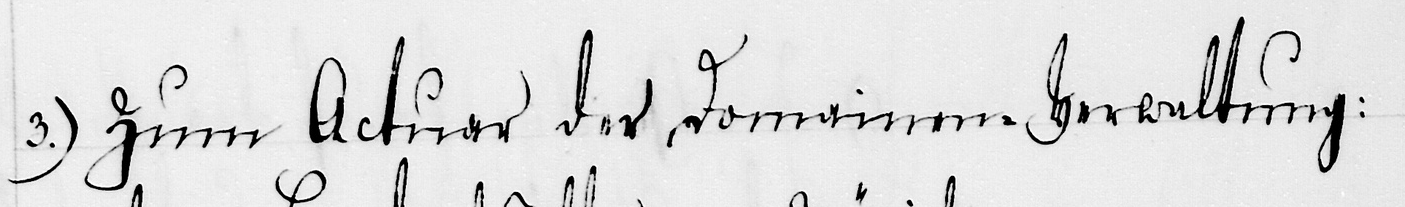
3.) Zum Actuar der Domainen-Verwaltung:
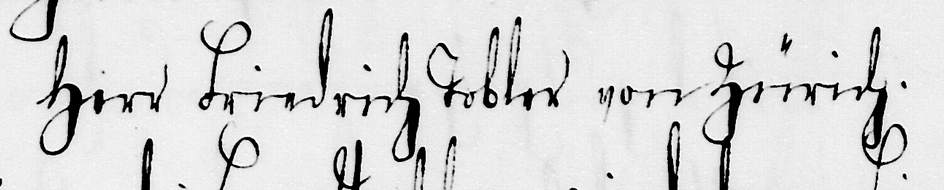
Herr Friedrich Tobler von Zürich.
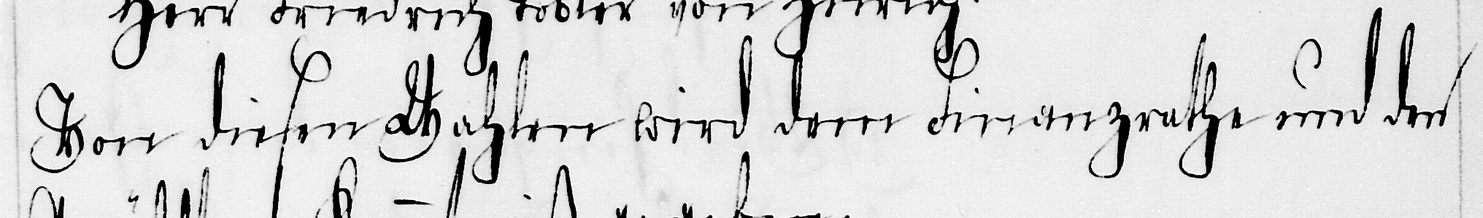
Von diesen Wahlen wird dem Finanzrathe und den
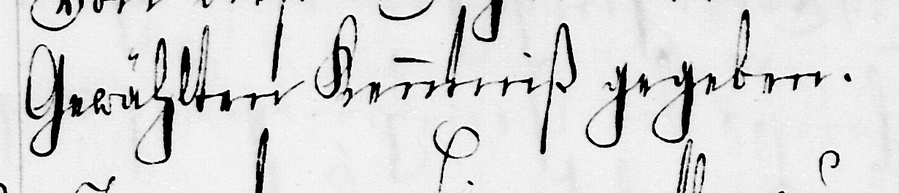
Gewählten Kenntniß gegeben.
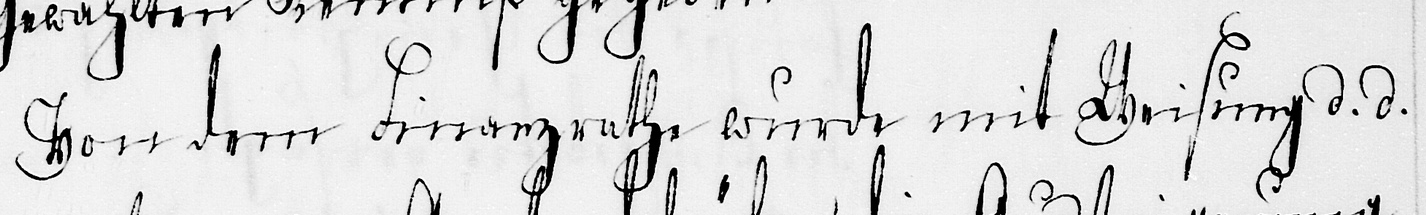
Von dem Finanzrathe wurde mit Weisung d. d.
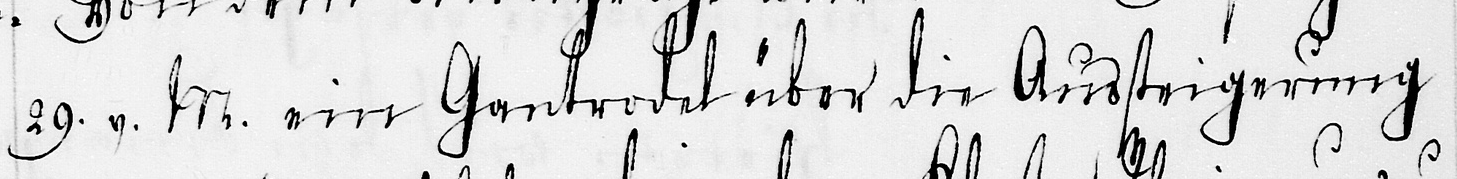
29. v. M. ein Gantrodel über die Ausssteigerung
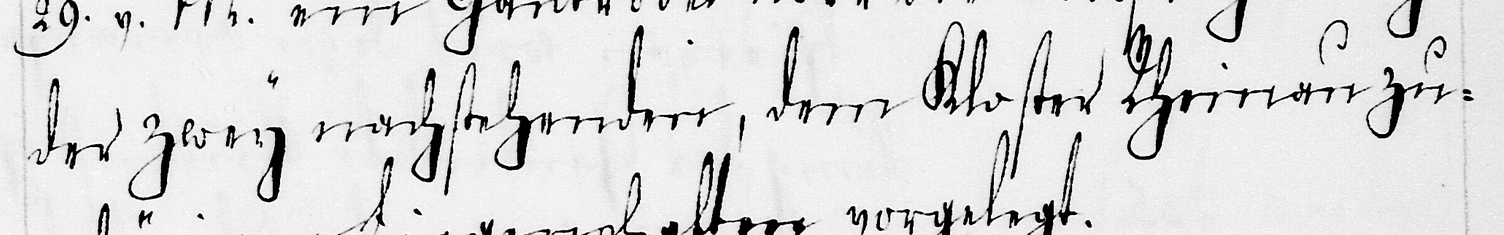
der zwey nachstehenden, dem Kloster Rheinau zu¬
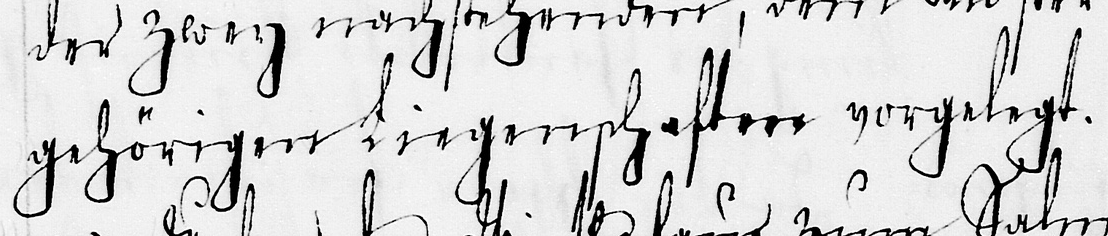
gehörigen Liegenschaften vorgelegt.
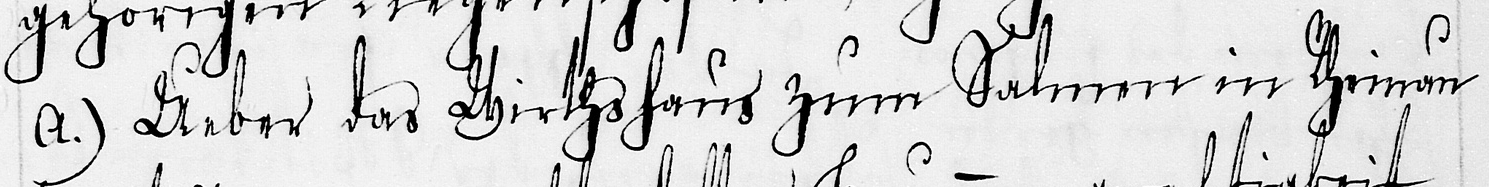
A.) Ueber das Wirthshaus zum Salmen in Rheinau
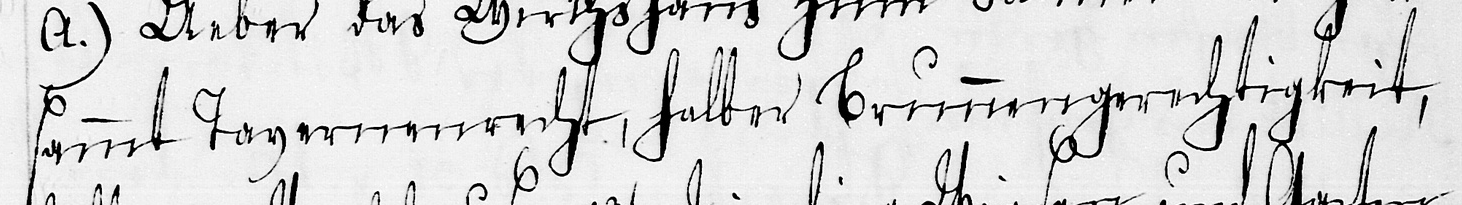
sammt Tavernenrecht, halber Brunnengerechtigkeit,
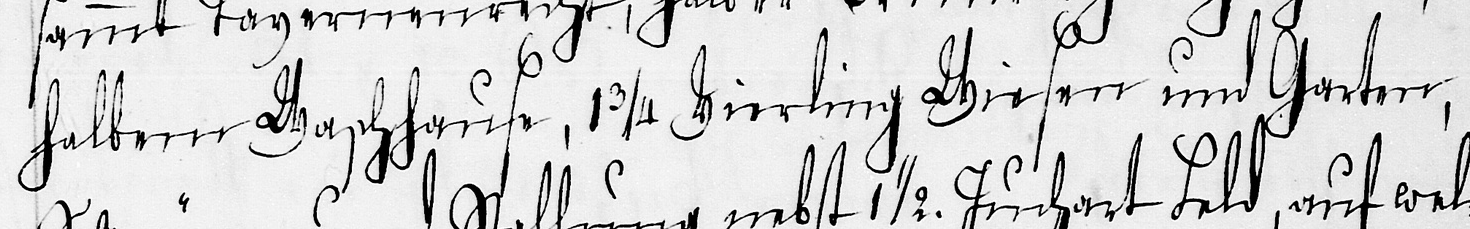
halbem Waschhause, 1 3/4. Vierling Wiesen und Garten,
